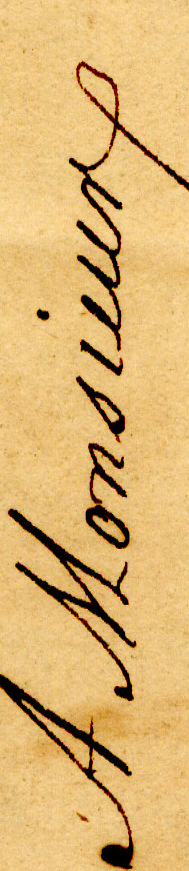A Monsieur
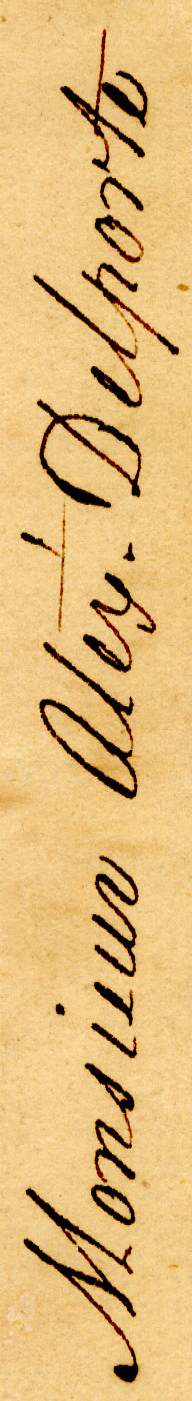Monsieur Alex. Delporte
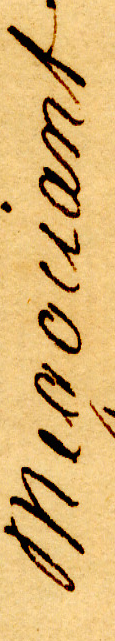negociant
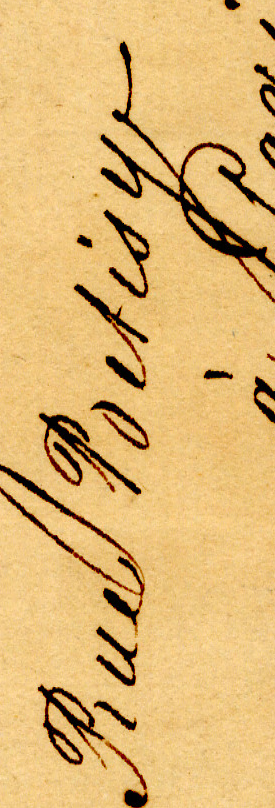Rue Poetisy
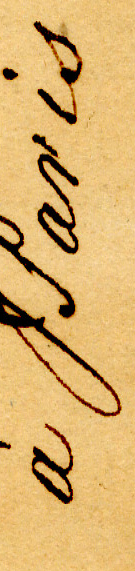à Paris.
